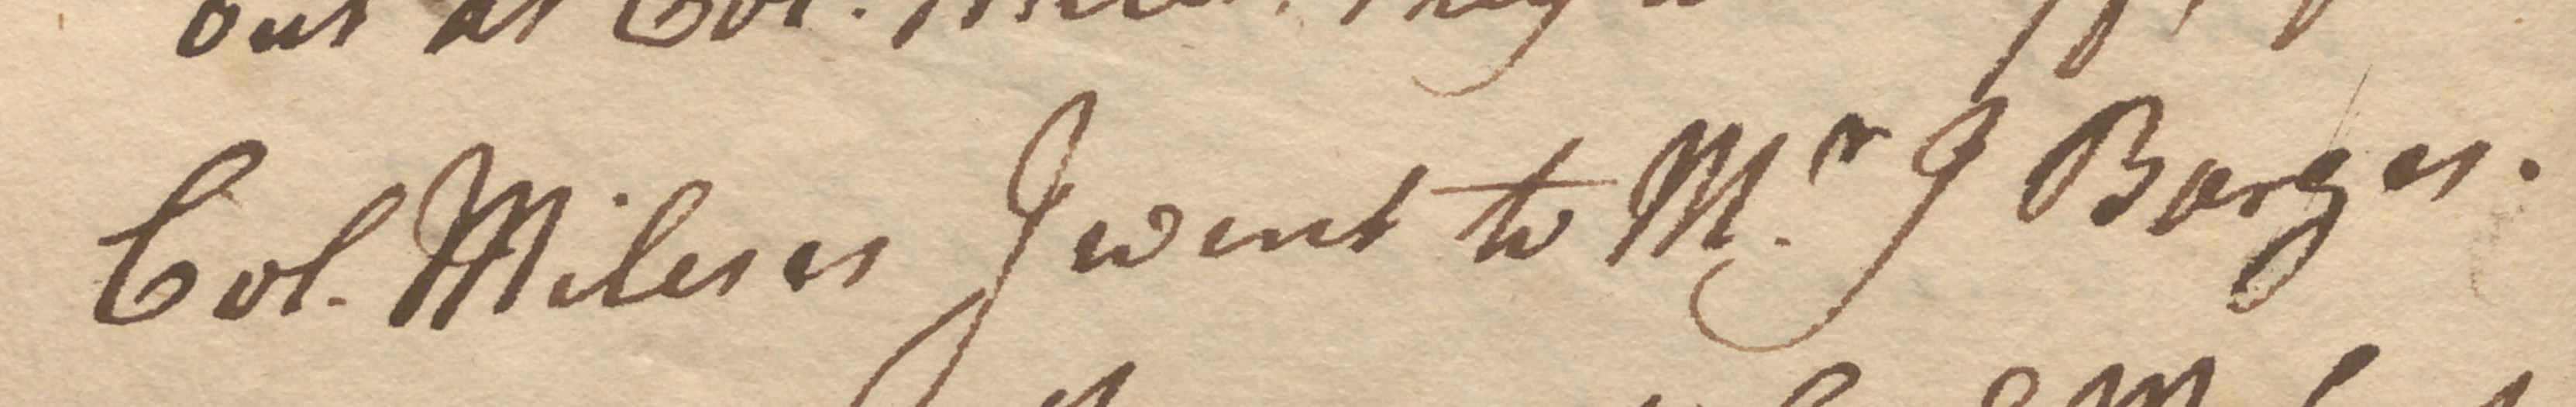Col. Mileses I went to M^r. J Barges
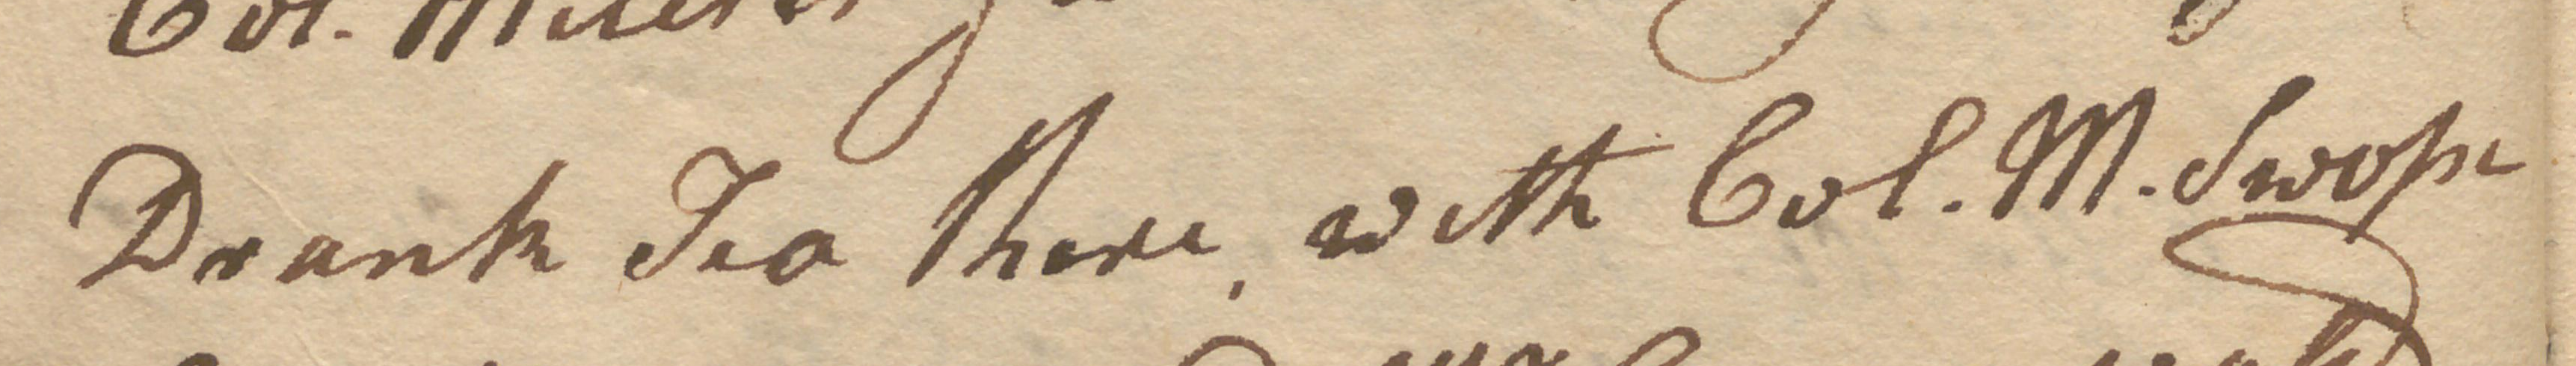Drank Tea there with Col. M. Swope
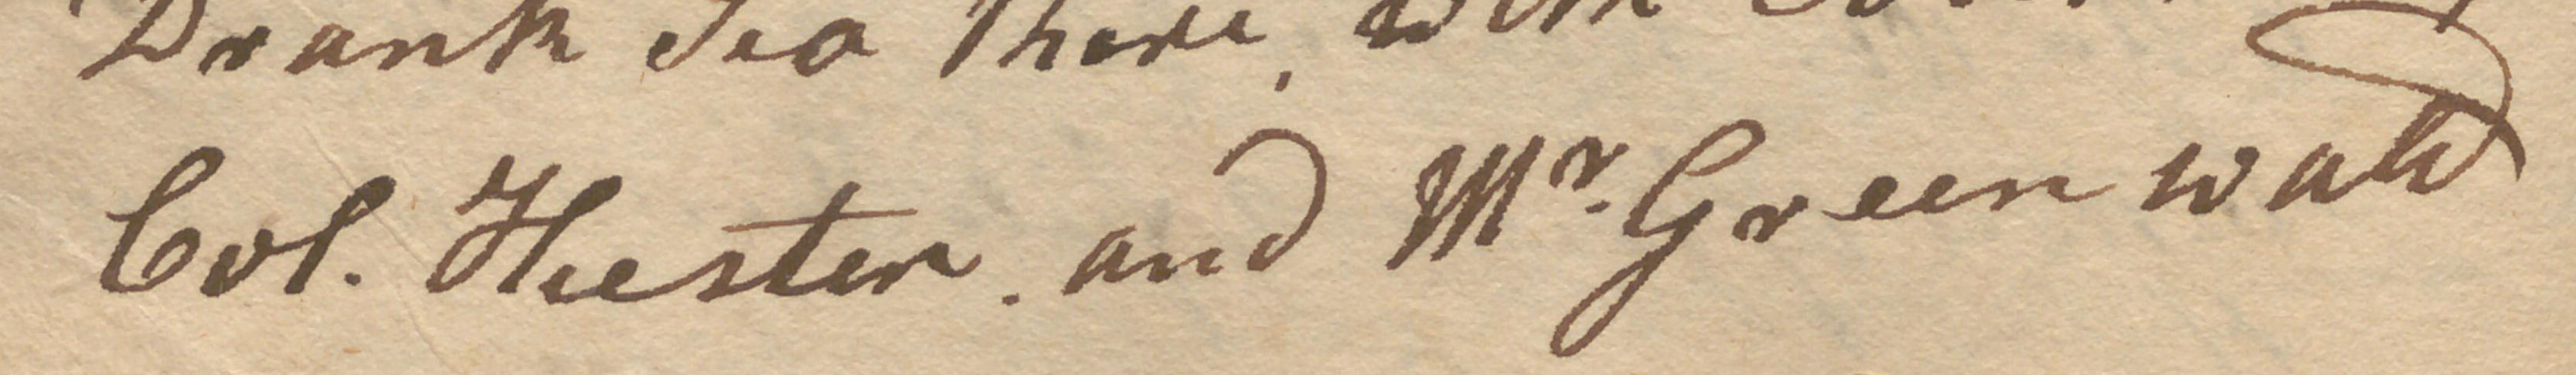Col. Huster, and M^r. Greenwald
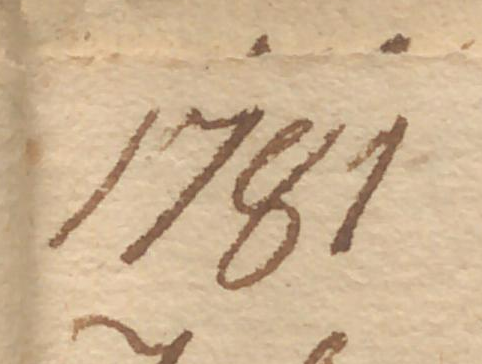1781
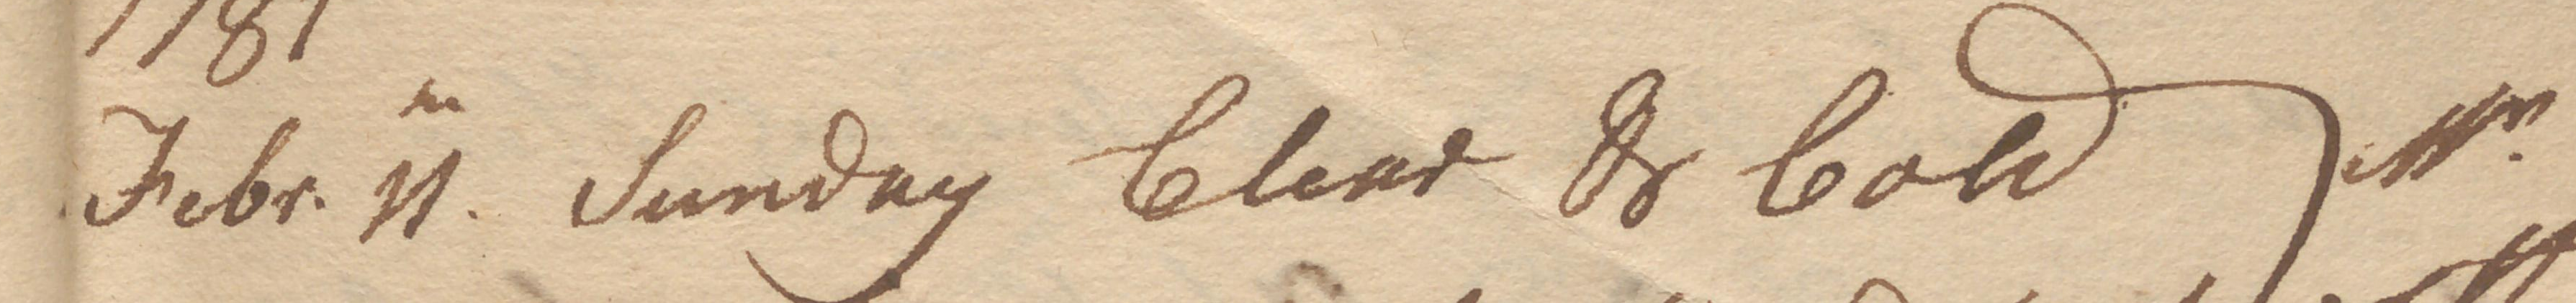Febr. 11^th. Sunday Clear & Cold M^r.
